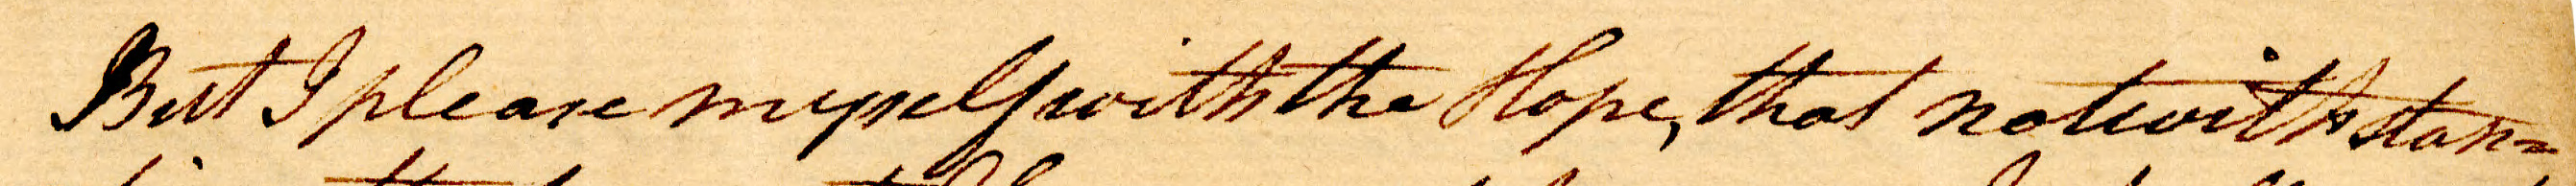But I please myself with the Hope, that notwithstan-
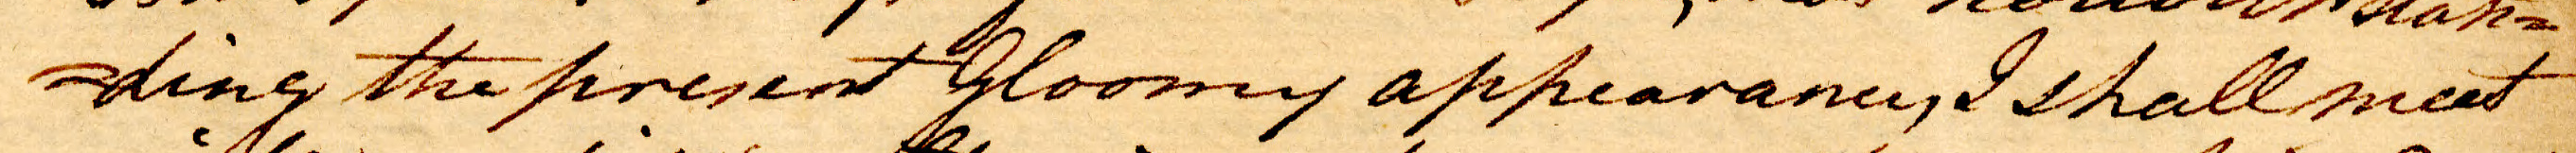-ding the present Gloomy appearance, I shall meet
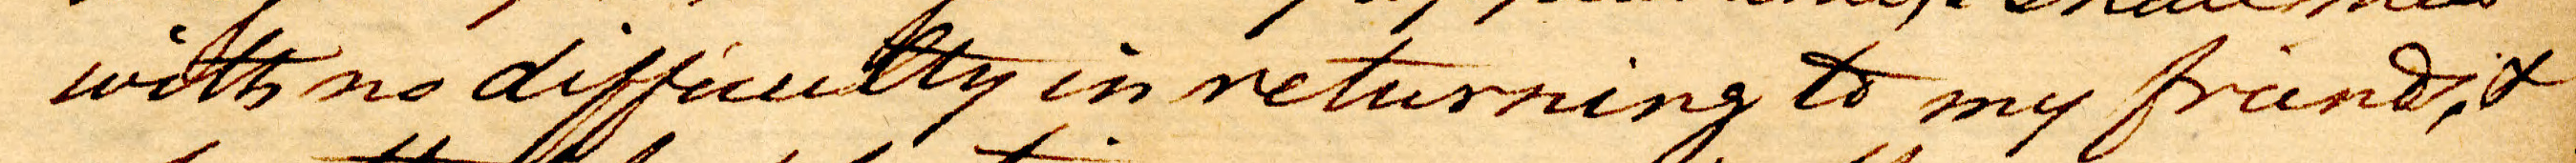with no difficulty in returning to my friends, &
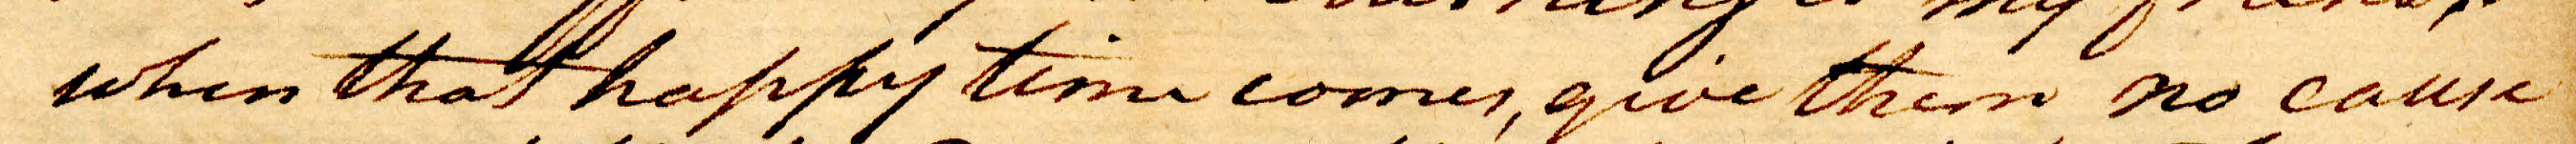when that happy time comes, give them no cause
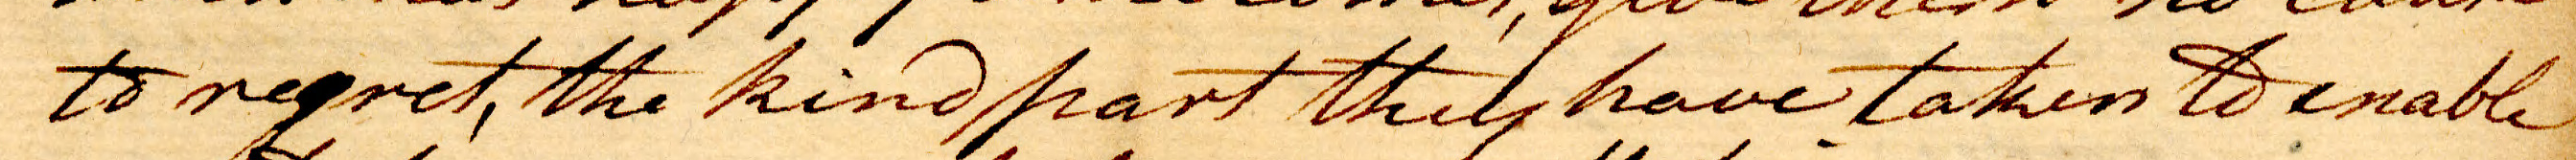to regret, the kind part they have taken to enable
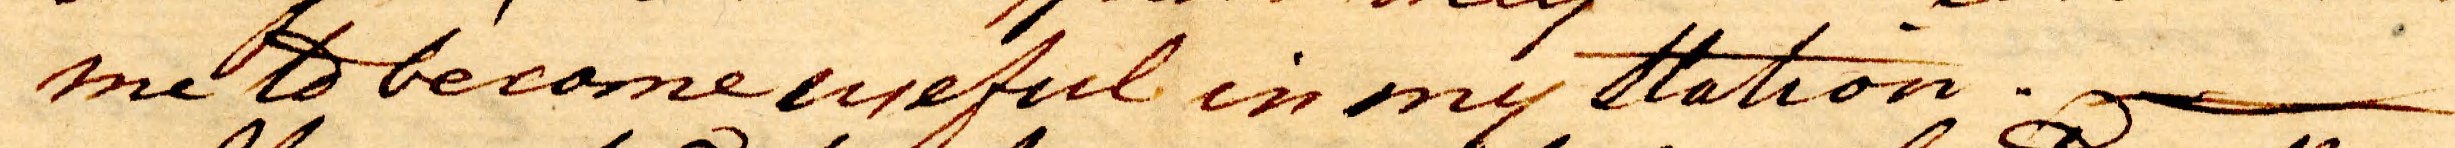me to become useful in my station.-
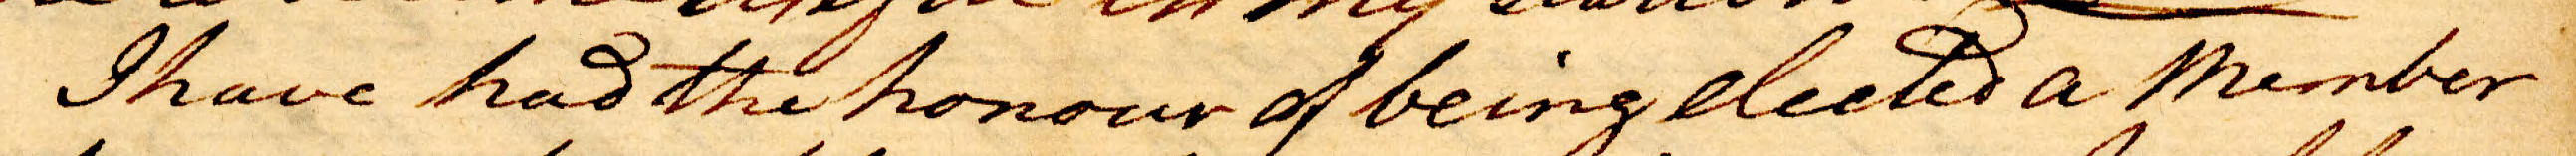I have had the honour of being elected a Member
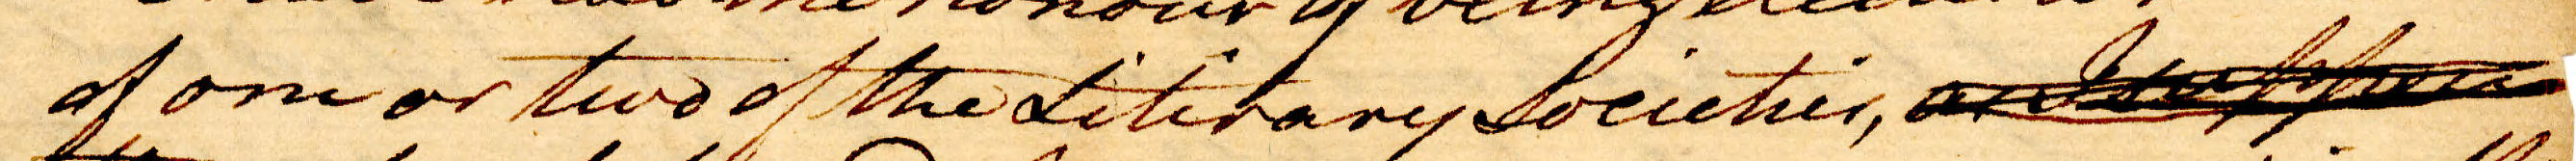of one or two of the Literary Societies, [or I suppose]
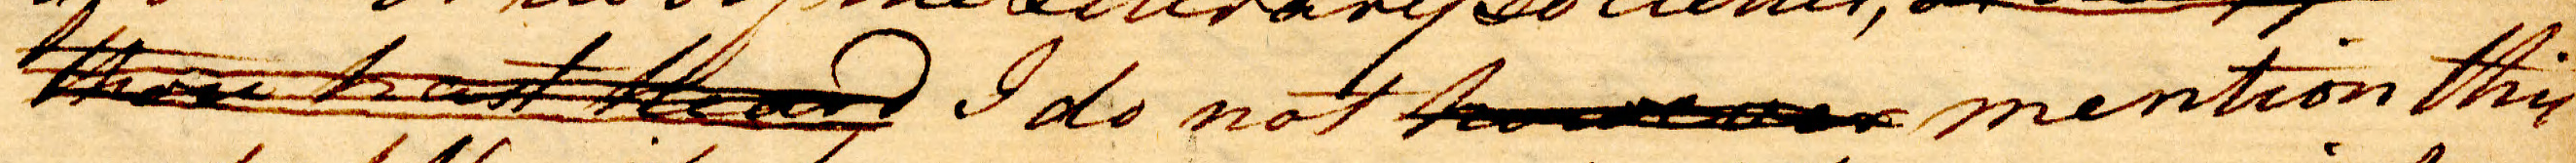[thou hast heard] I do not [however] mention this
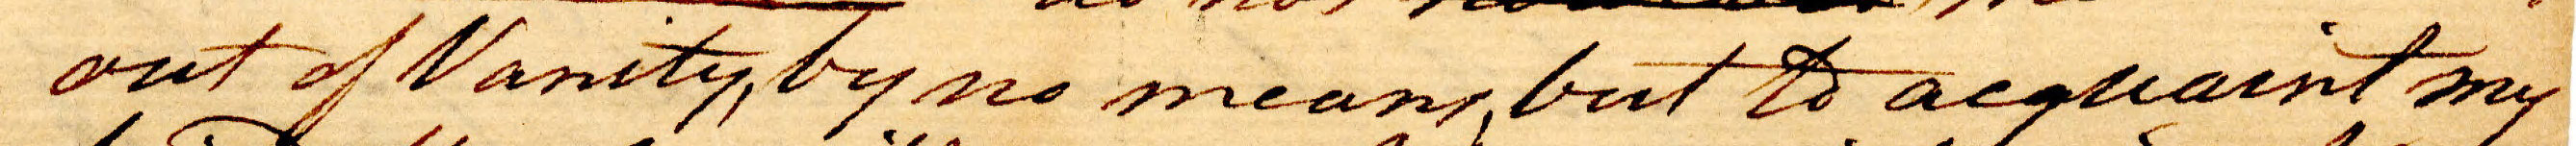out of Vanity, by no means, but to acquaint my
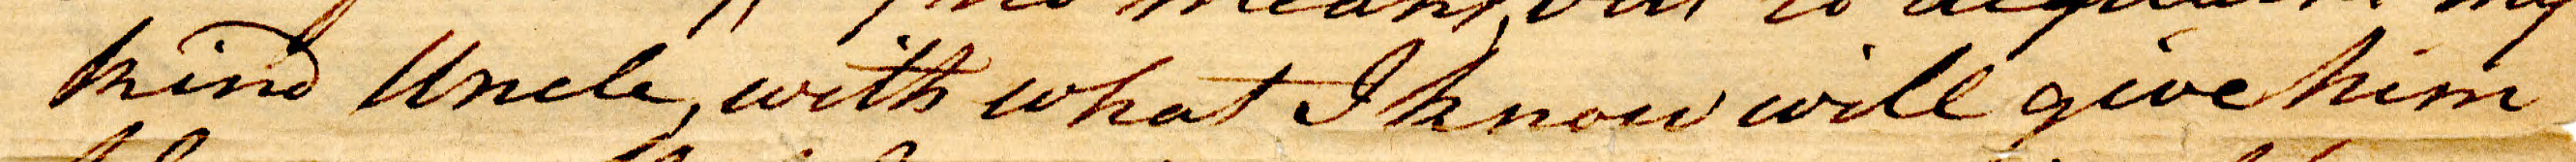kind Uncle with what I know will give him
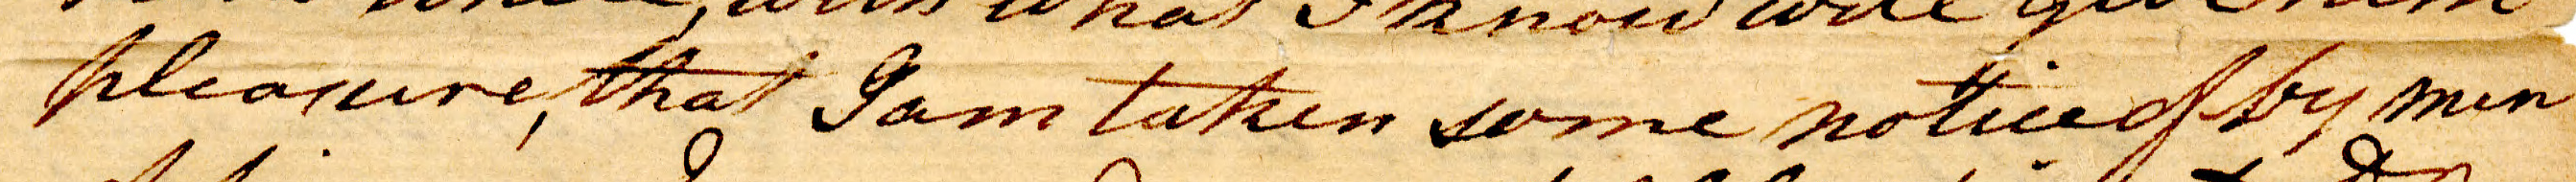pleasure, that I am taken some notice of by men
